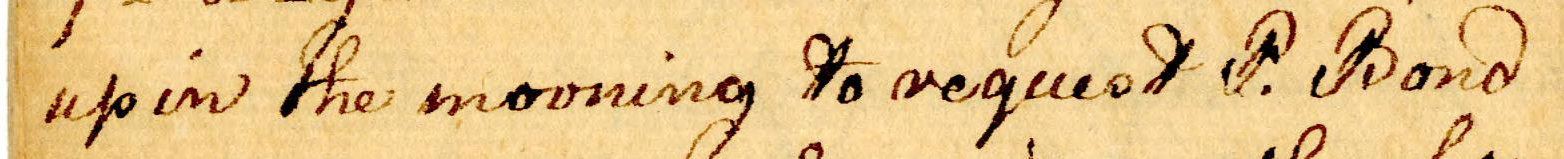up in the morning to request P. Bond
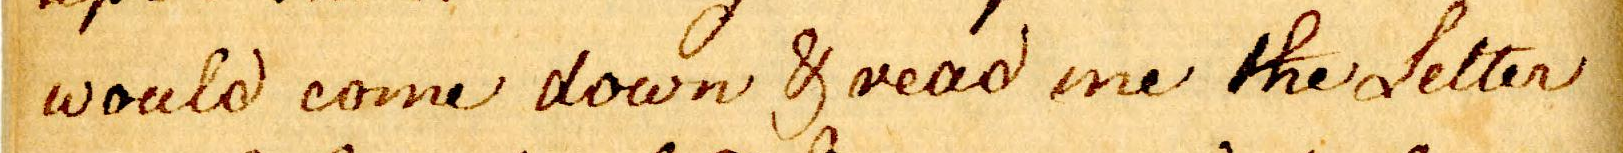would come down & read me the Letter
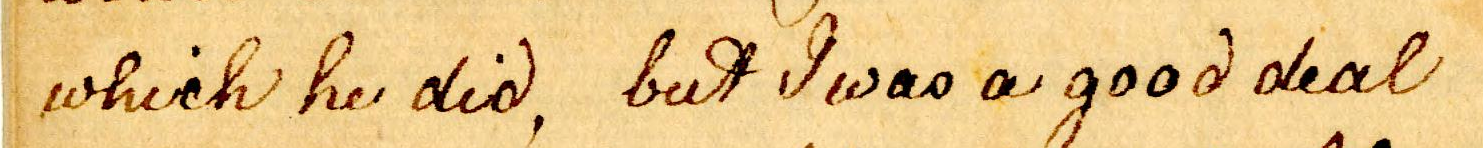which he did, but I was a good deal
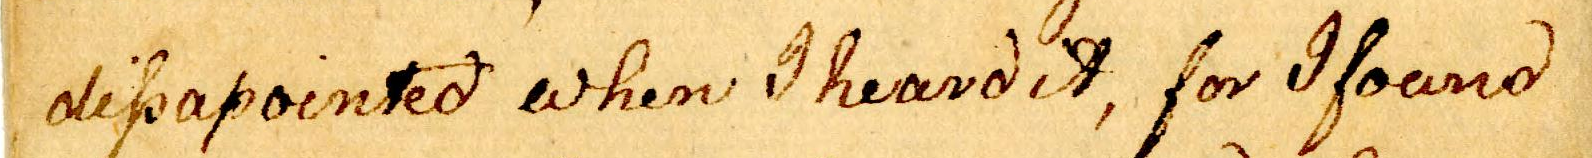dissapointed when I heard it, for I found
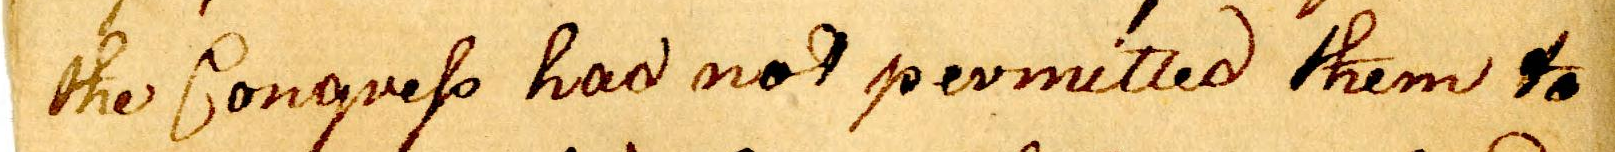the Congress had not permitted them to
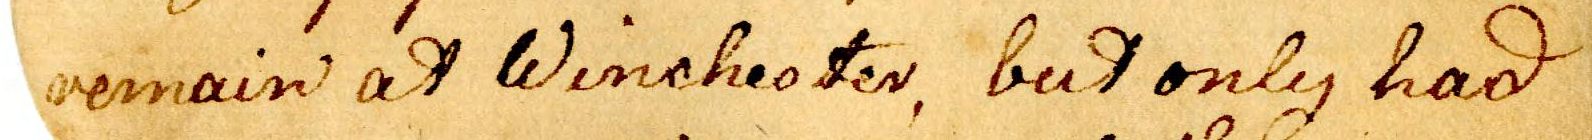remain at Winchester, but only had
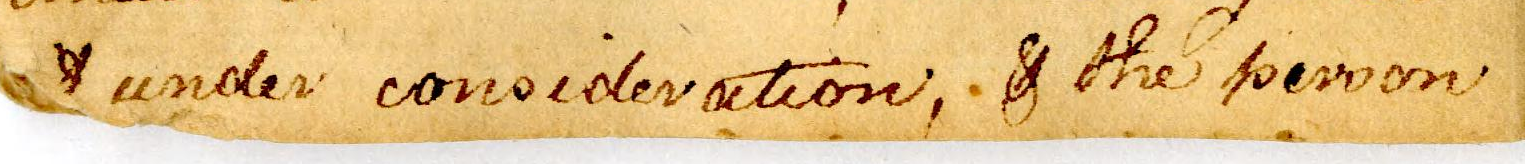& under consideration, & the person
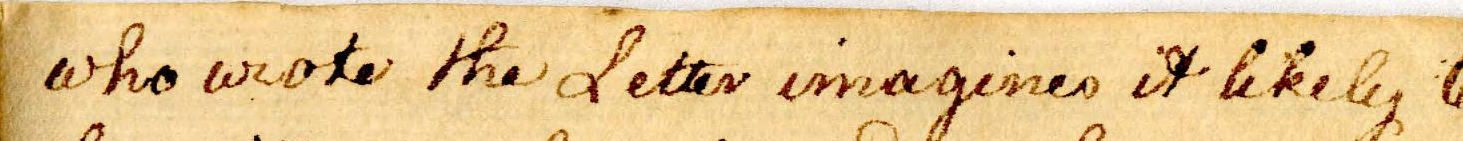who wrote the Letter imagines it likely
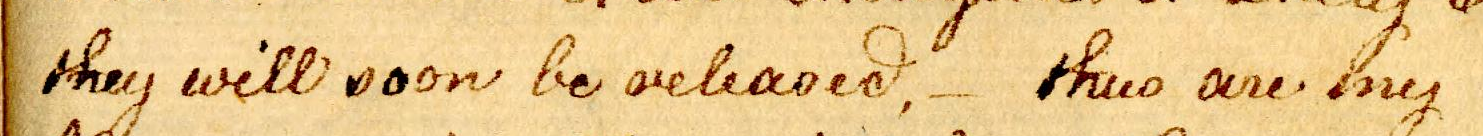they will soon be released,- thus are my
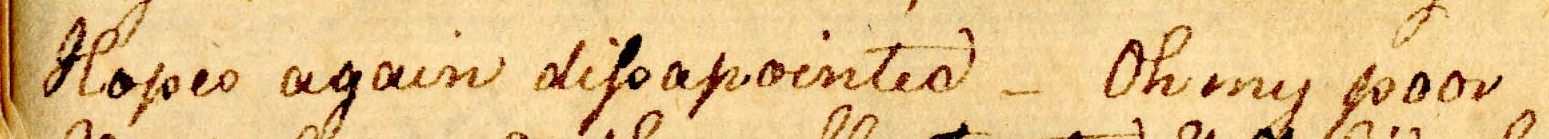Hopes again dissapointed- Oh my poor
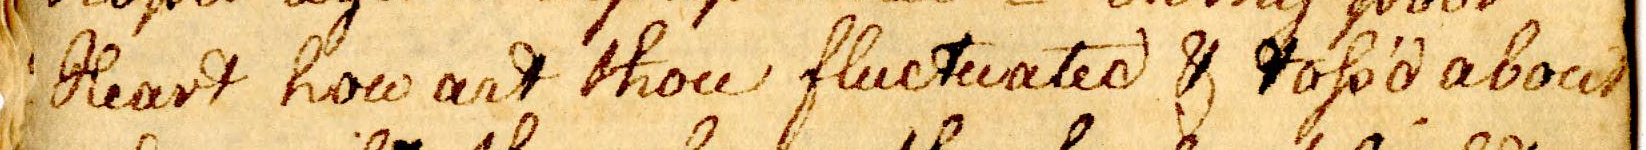Heart how art thou fluctuated & toss'd about
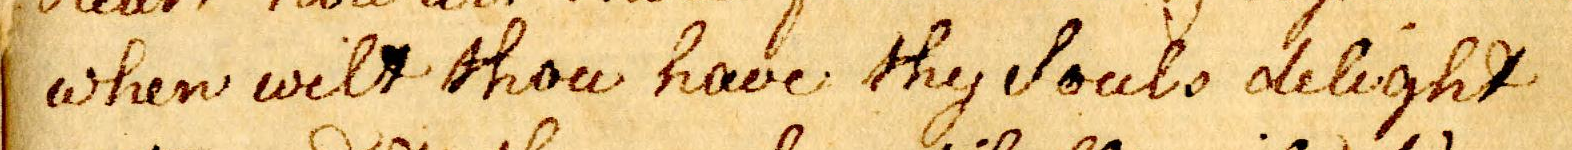when wilt thou have thy Souls delight
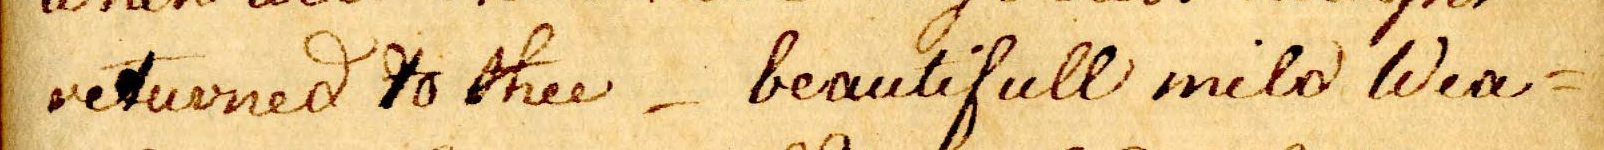returned to thee- beautifull mild Wea-
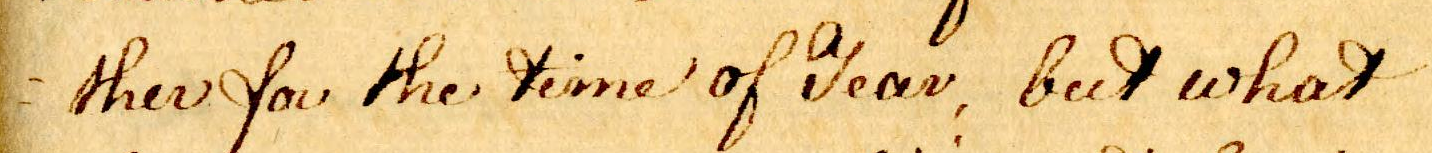-ther for the time of Year, but what
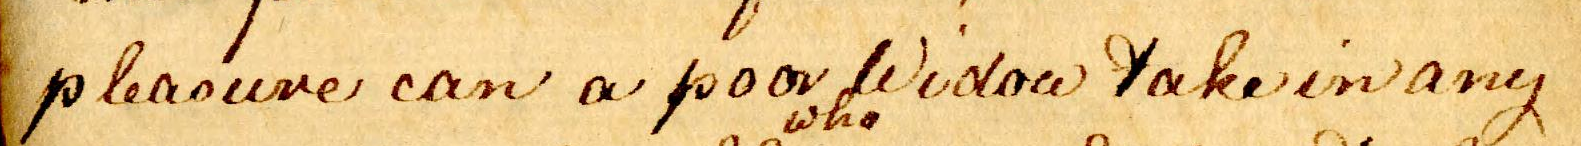pleasure can a poor Widow take in any
